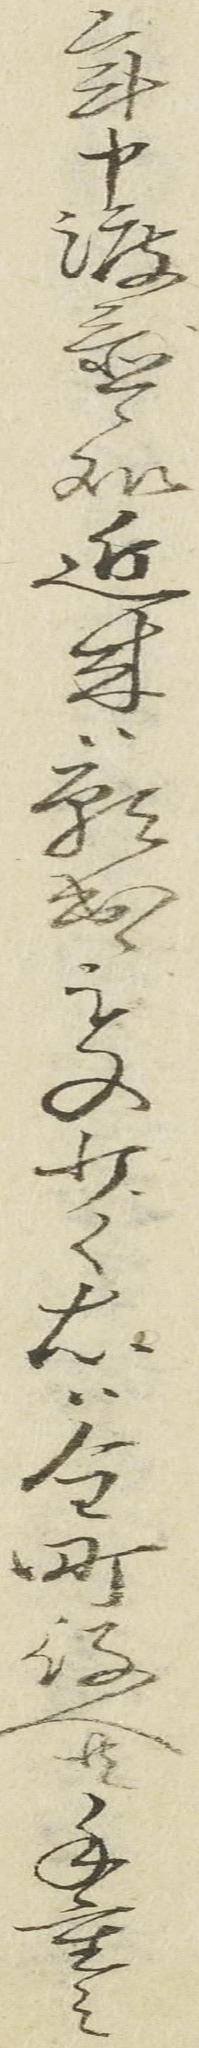年申渡置候処近来ハ願出候もの少く右ハ全町役人共手重之
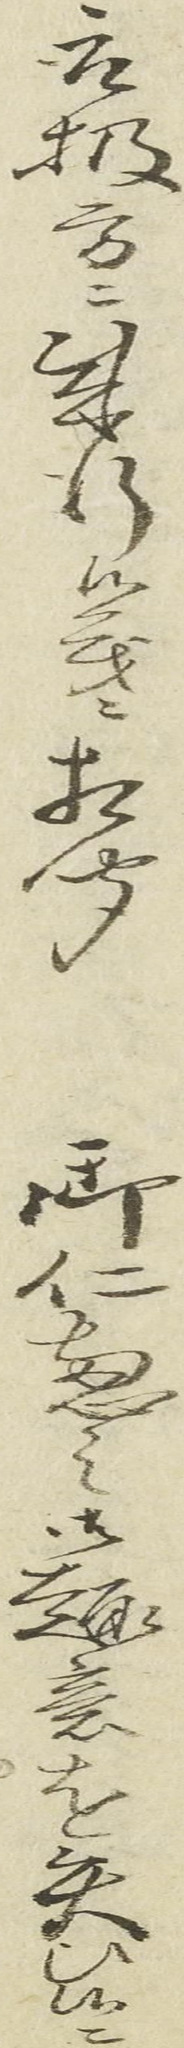取扱方ニ成行候義ニ相聞御仁恵之御趣意を失ひ候ニ
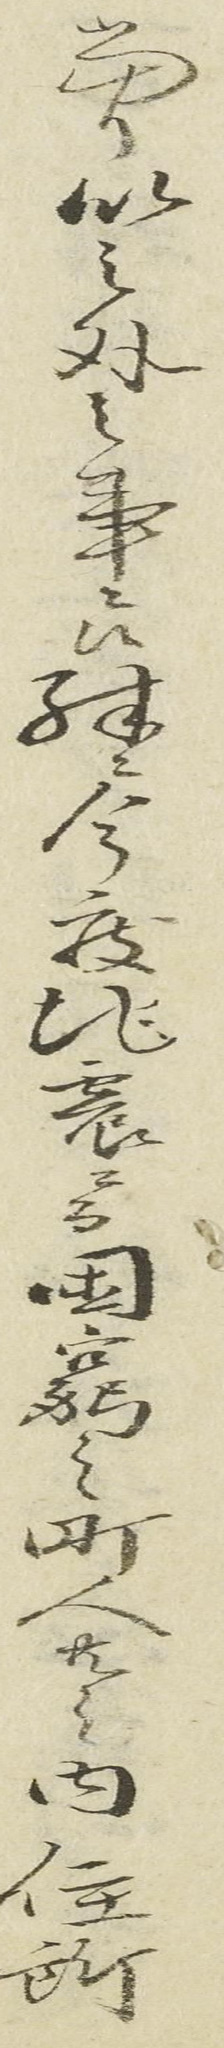当り以之外之事ニ候殊二今度地震ニ而困窮之町人共之内住所
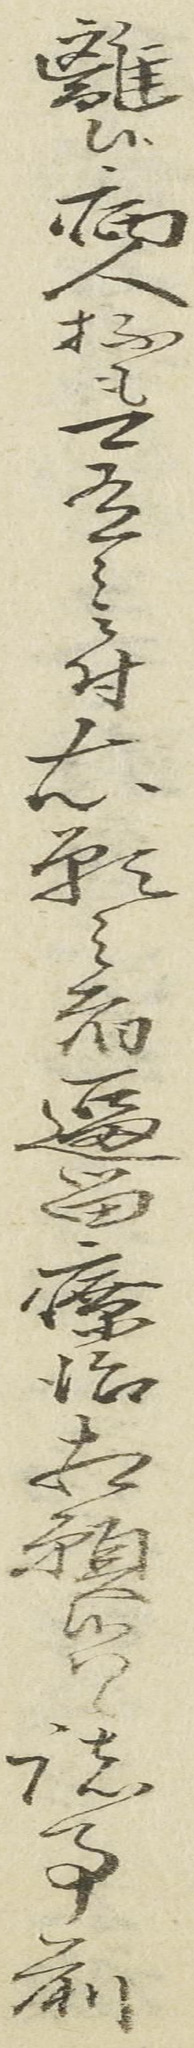離候病人抔も可有之ニ付右願之者逗留療治相願候ハゝ諸事前
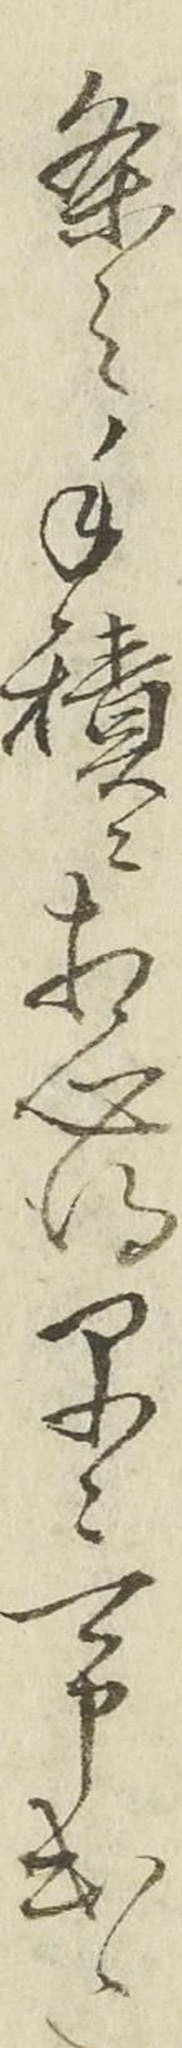条の手積ニ相心得早々可申出候
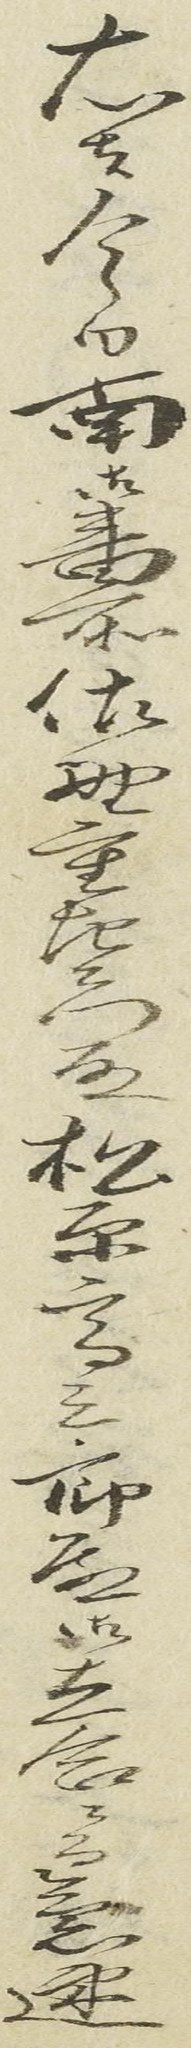右は今日南御番所佐野重左衛門殿松原高三郎殿御立合ニ而急速
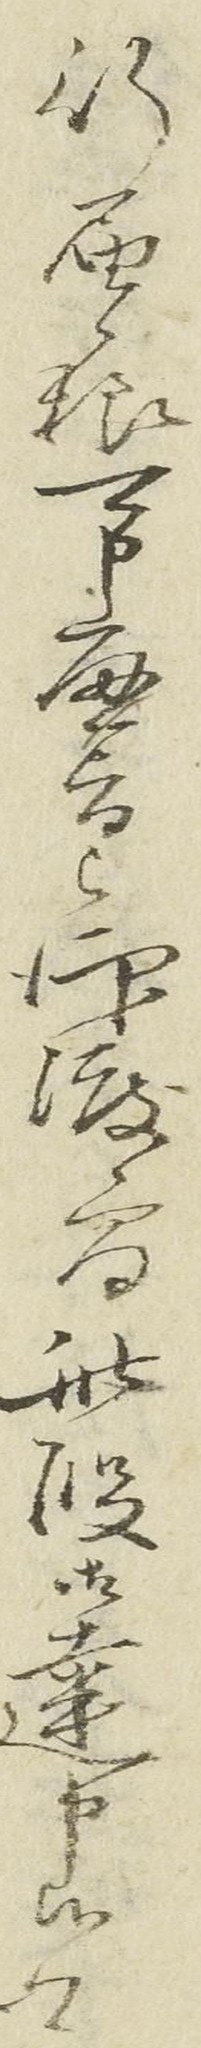行届候様可申通旨被仰渡候間此段御達申候以上
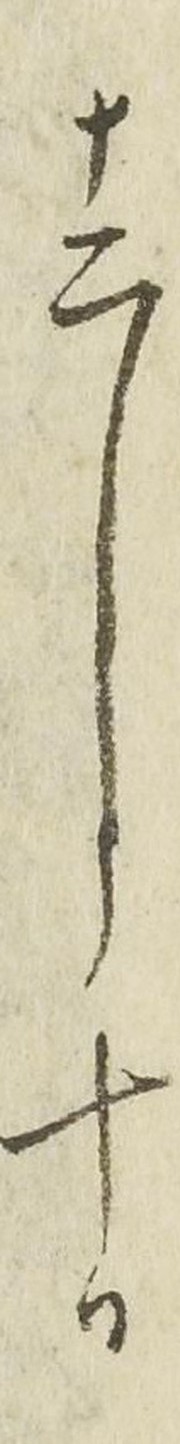十二月十日
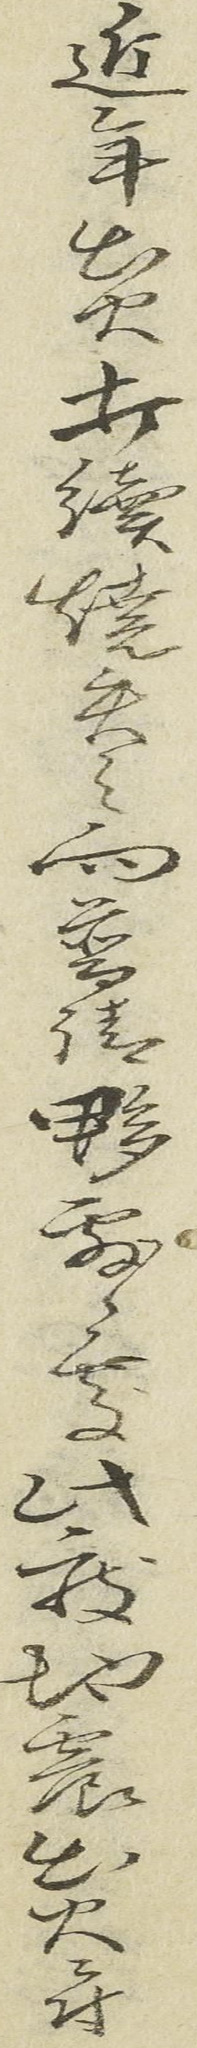近年出火打続焼失之向普請夥敷候処此度地震出火ニ付

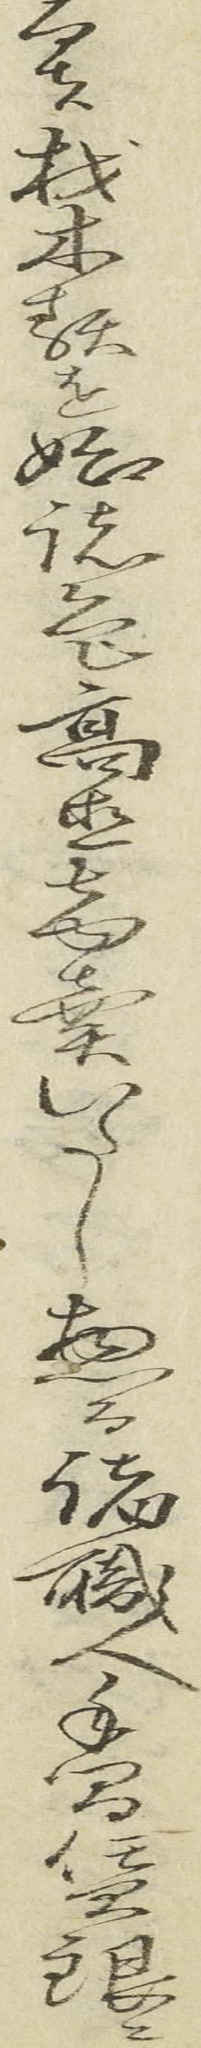ては材木類を始諸色高値商売いたし惣而諸職人手間賃銀に
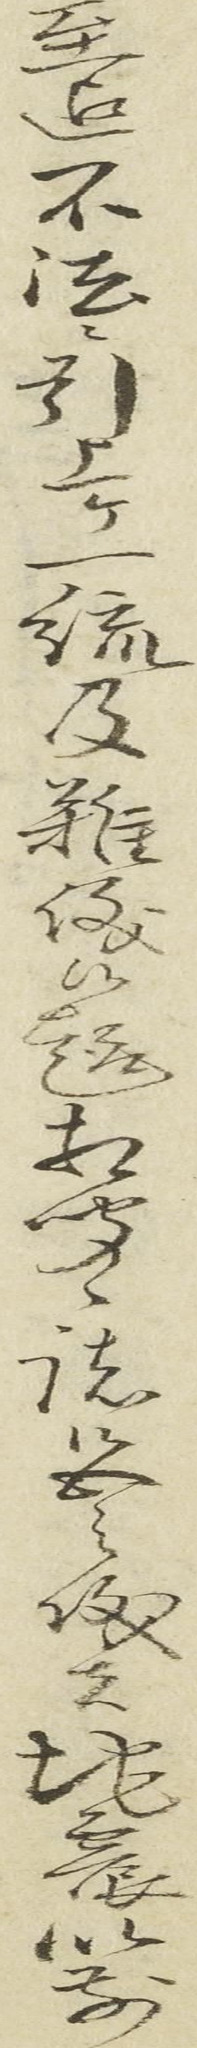至迄不法に引上け一統及難儀候趣相聞候諸色の儀は地震以前
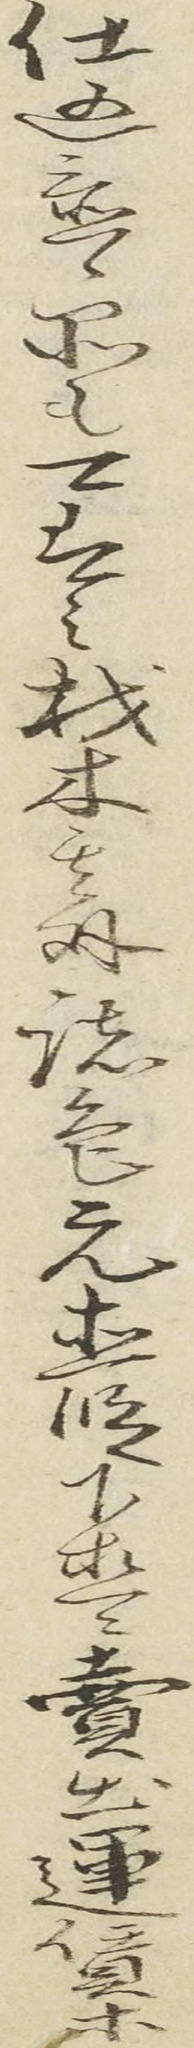仕込置候品も可有之材木其外諸色元直段下直ニ売出運賃等
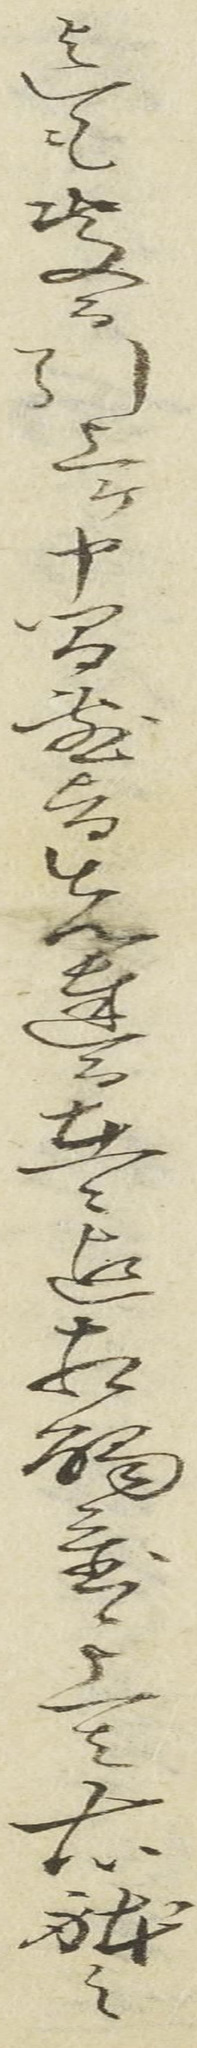迄も決而引上け申間敷旨先達而在々迄相触置候上は右躰之
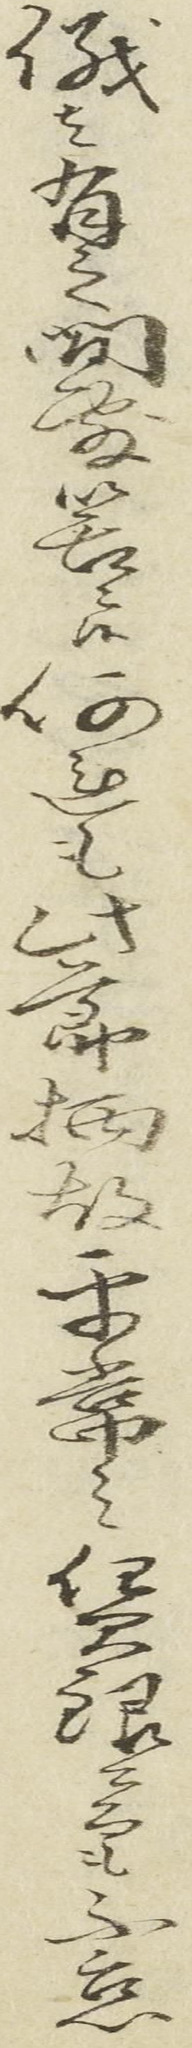儀は有之間敷筈ニ候何れも此節柄故平常之賃金ニ而も不怠
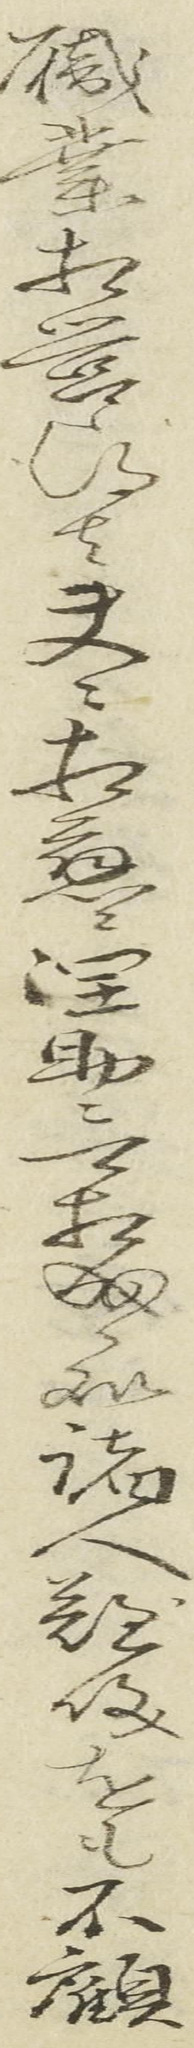職業相営候得は夫々相応ニ潤助ニ可相成候処諸人難儀をも不顧
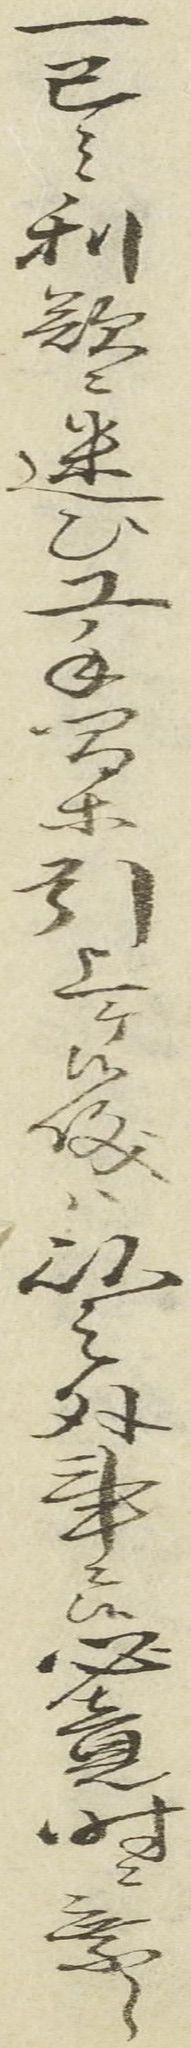一己之利歎ニ迷ひ工手間等引上ヶ候義ハ以之外事ニ候必竟時ニ乗し
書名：安政二乙卯年十月二日大地震之事
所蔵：東京大学地震研究所図書室 Earthquake Research Institute Library, The University of Tokyo, JAPAN
